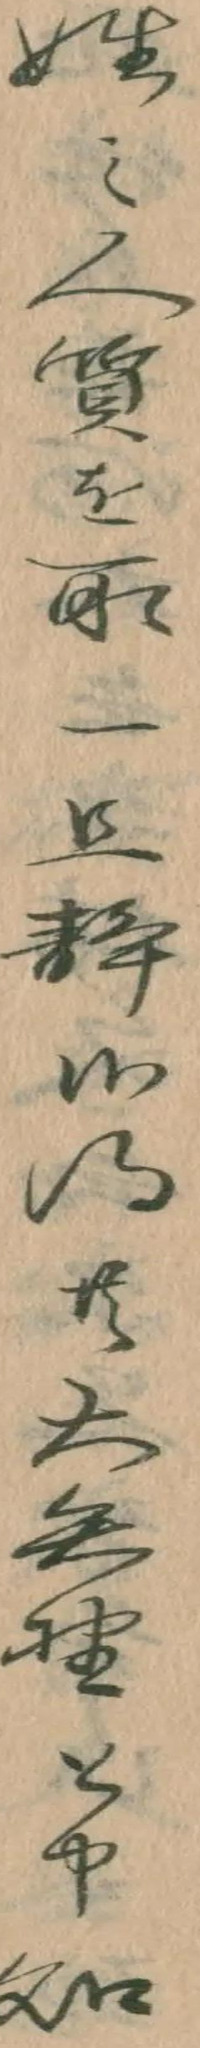姓之人質を取一旦静候得共大矢野と申処
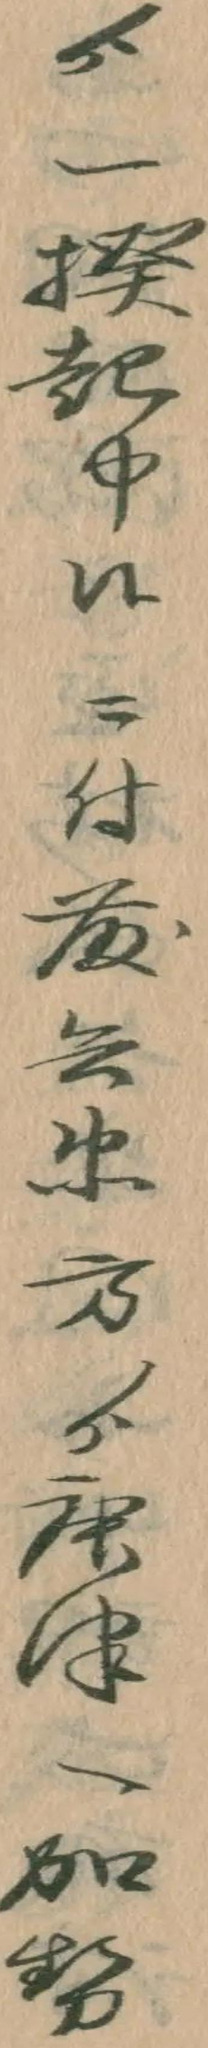ゟ一揆起申候に付藤兵衛方ゟ唐津へ加勢
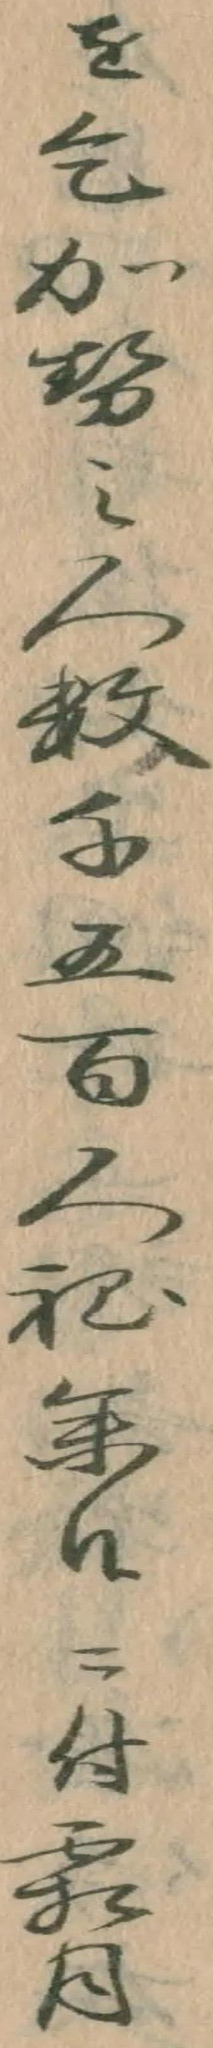を乞加勢之人数千五百人程参候に付霜月
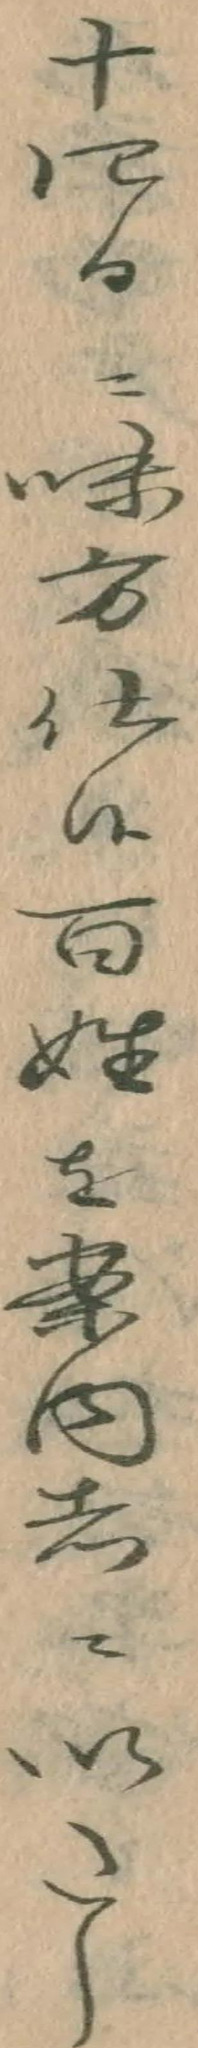十四日に味方仕候百姓を案内者に以たし
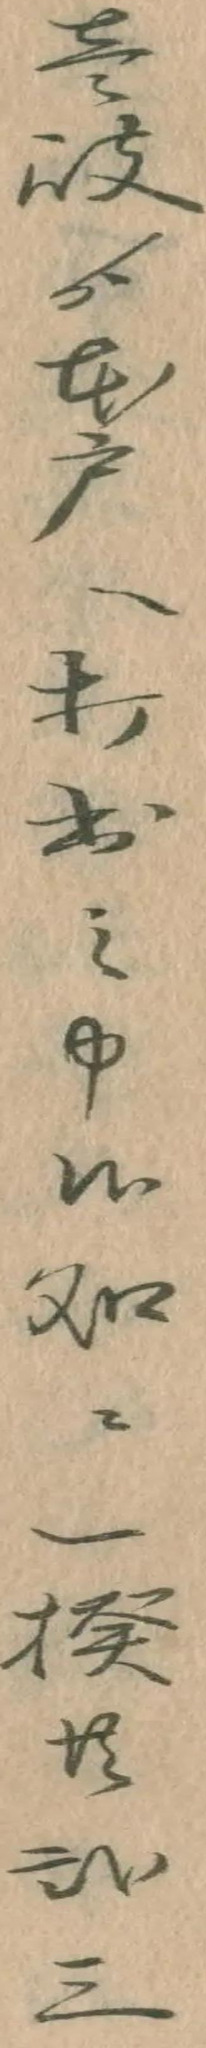壱岐ゟ本戸へ打出之申候処に一揆共弐三
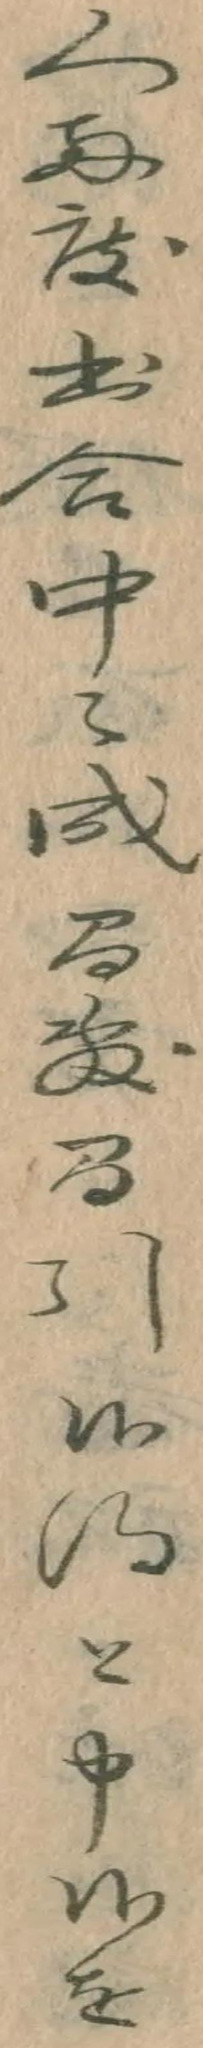人両度出合中に成間敷間引候得と申候を
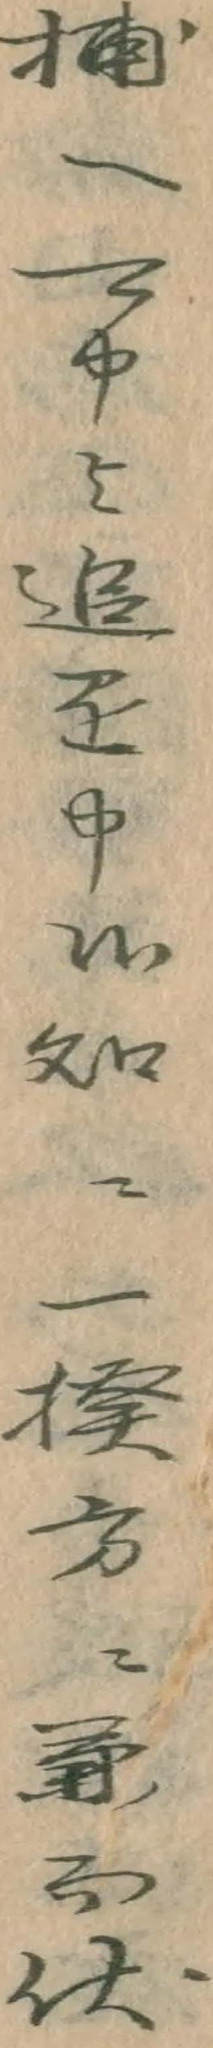捕へ可申与追懸申候処に一揆方に兼而伏
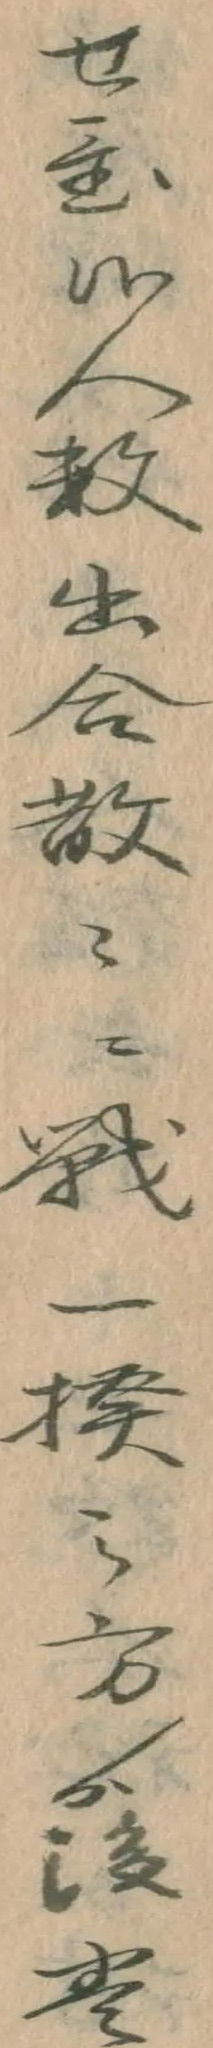せ置候人数出合散々に戦一揆之方ゟ後巻
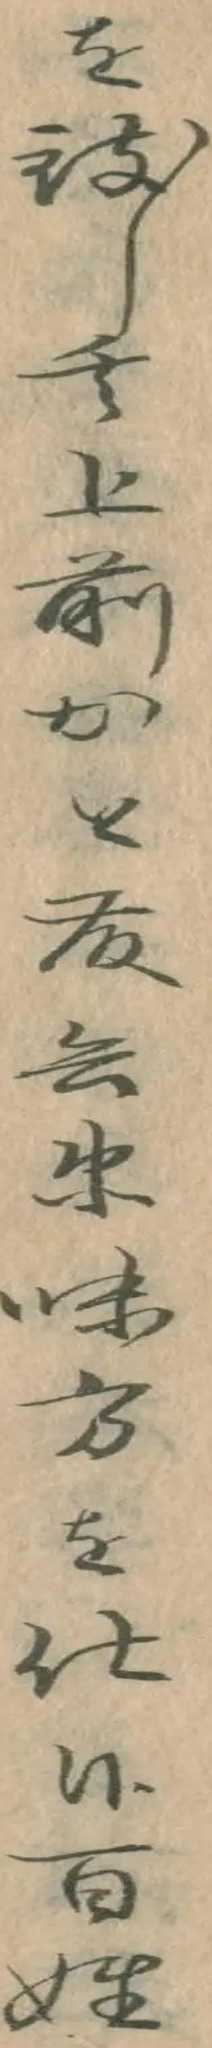を致し其上前かと藤兵衛味方を仕候百姓
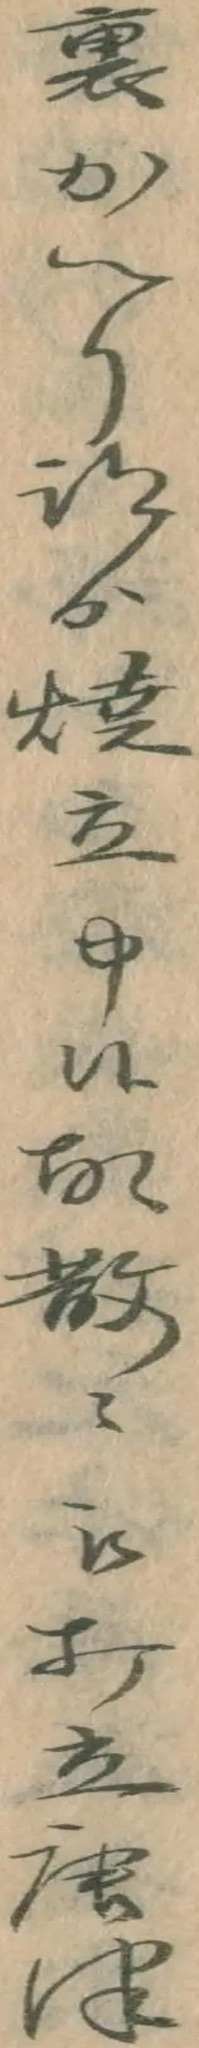裏かへり跡ゟ焼立申候故散々被打立唐津

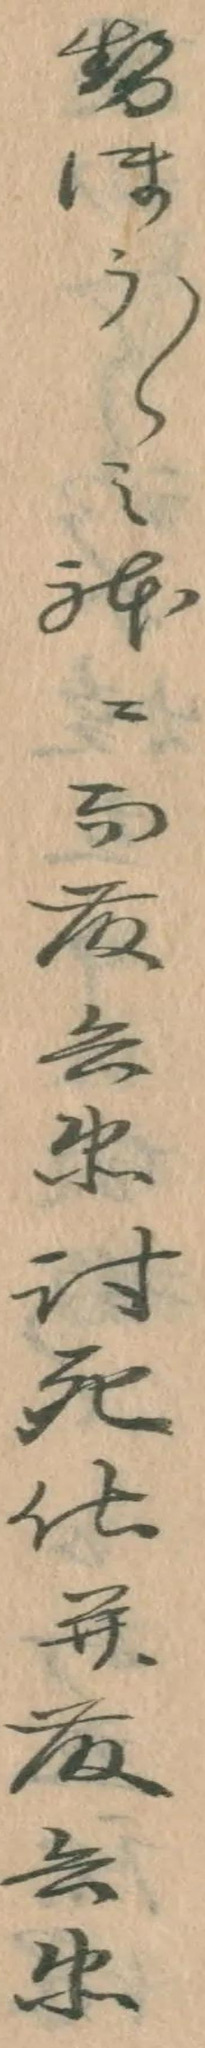勢ほう〱之躰に而藤兵衛討死仕幷藤兵衛
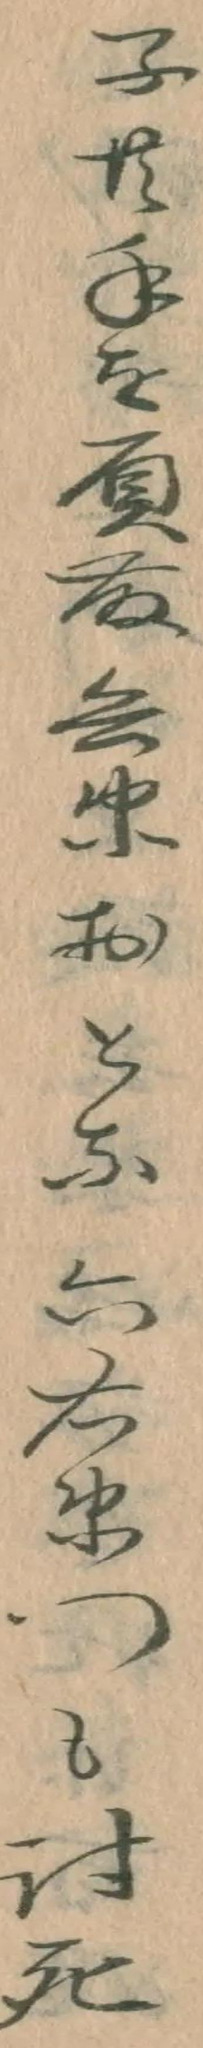子共手を負藤兵衛おとな六右衛門も討死
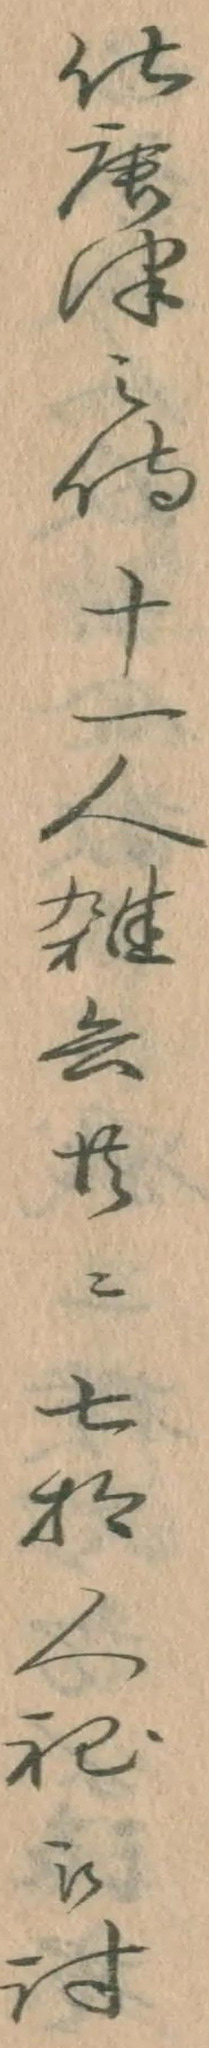仕唐津之侍十一人雑兵共に七拾人程被討
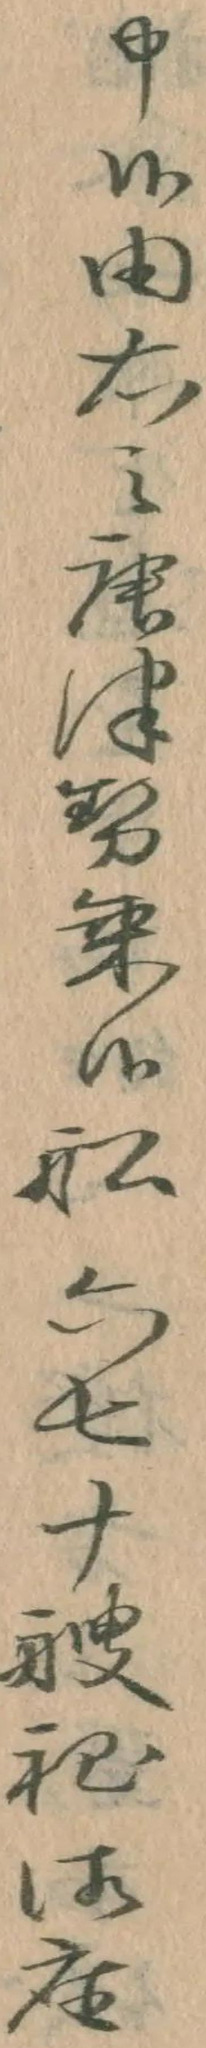申候由右之唐津勢乗候舩六七十艘程御座
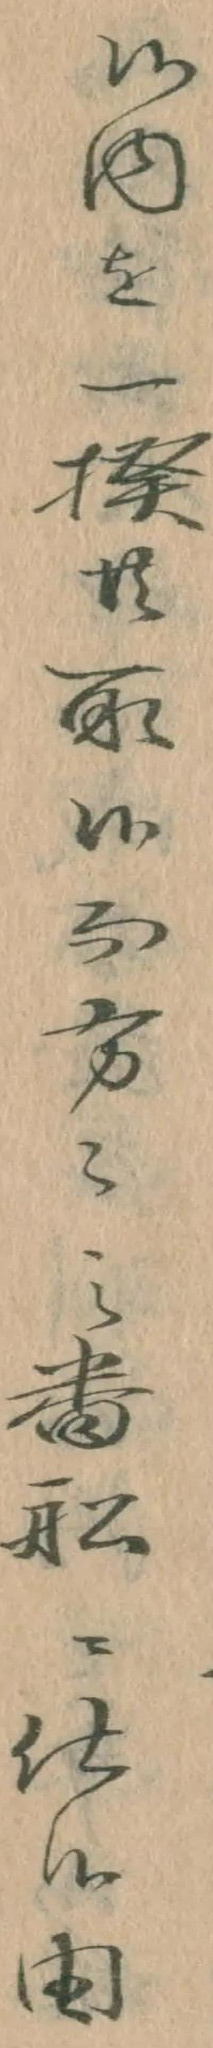候内を一揆共取候而方々之番舩に仕候由
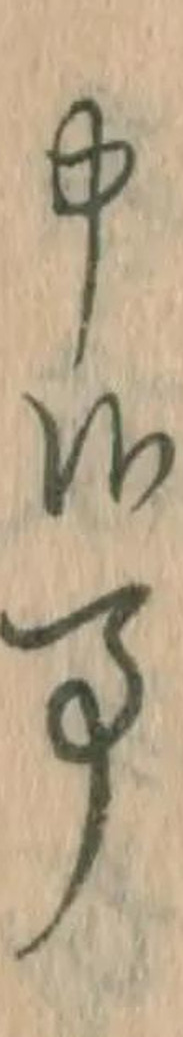申候事
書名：切支丹御退治記 49巻. [4]
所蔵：国立国会図書館 National Diet Library, JAPAN
